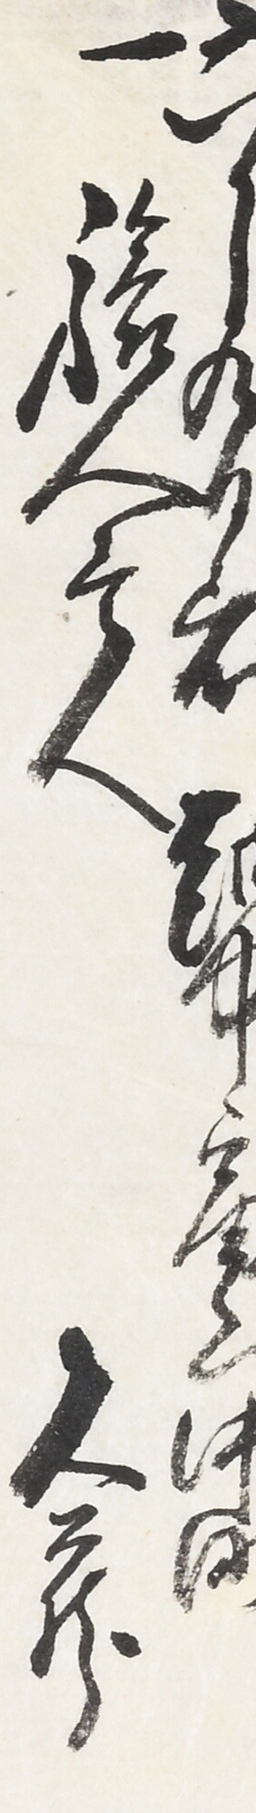一旅人壱人久蔵・
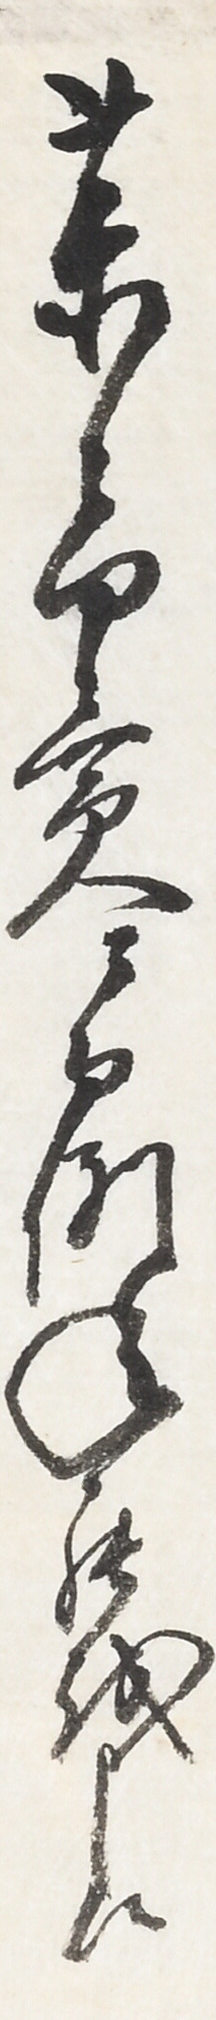薬商売ニ而例年罷越申候
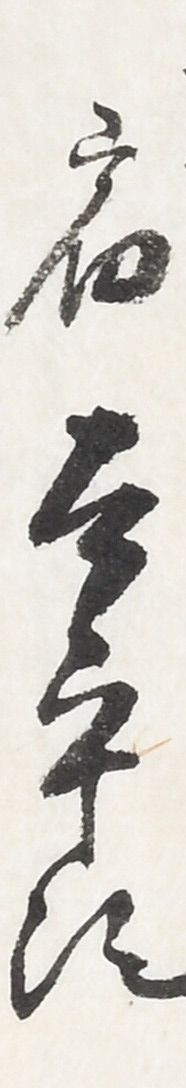宿太平次
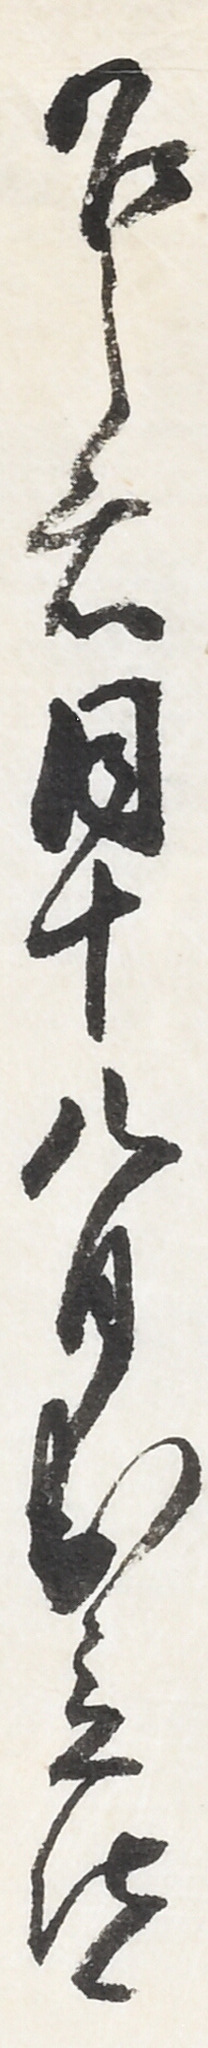右之者同十八日出立仕候
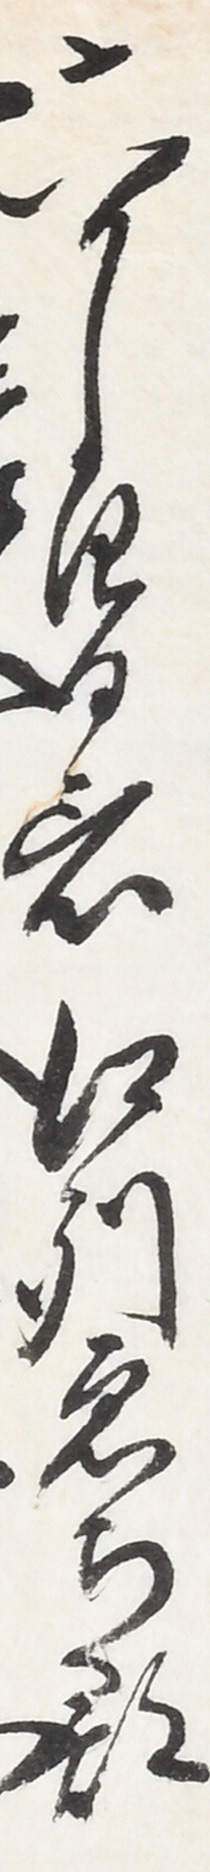六月四日着江州ゑち郡
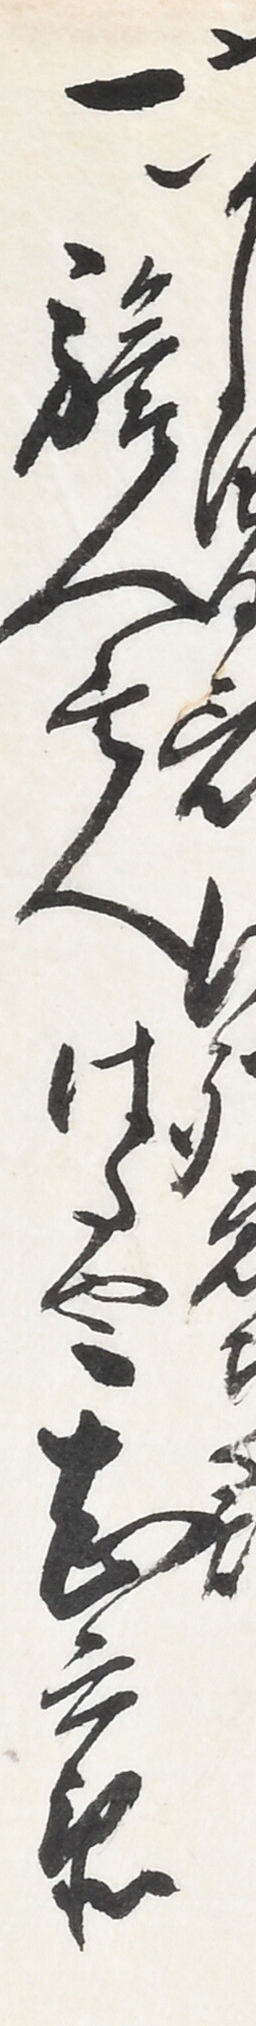一旅人壱人はたや甚兵衛・
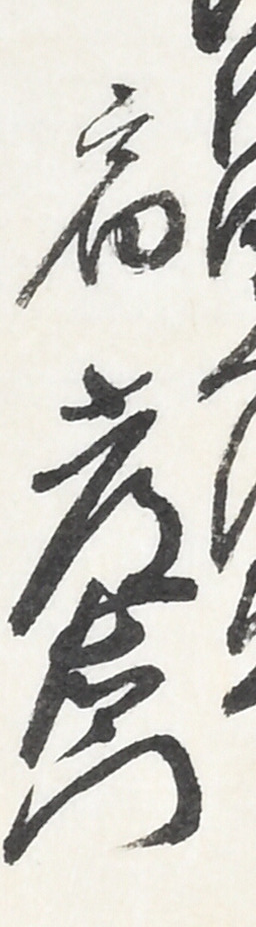宿常右衛門
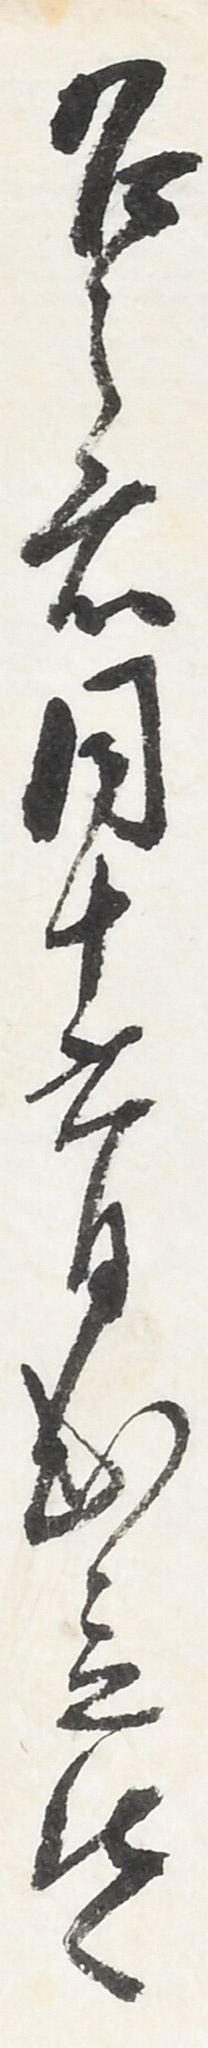右之者同十六日出立仕候
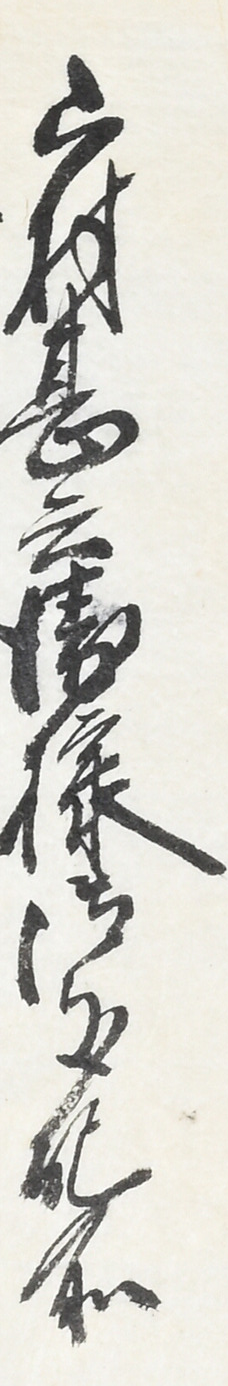山村甚兵衛様御支配所
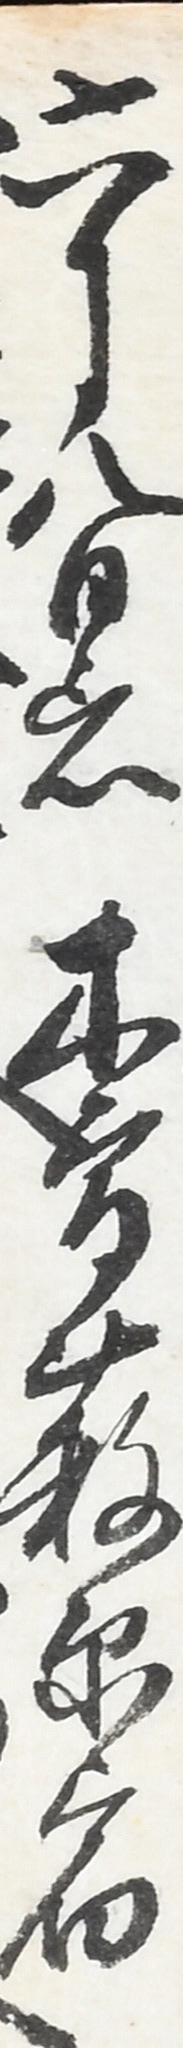六月八日着木曽藪原宿
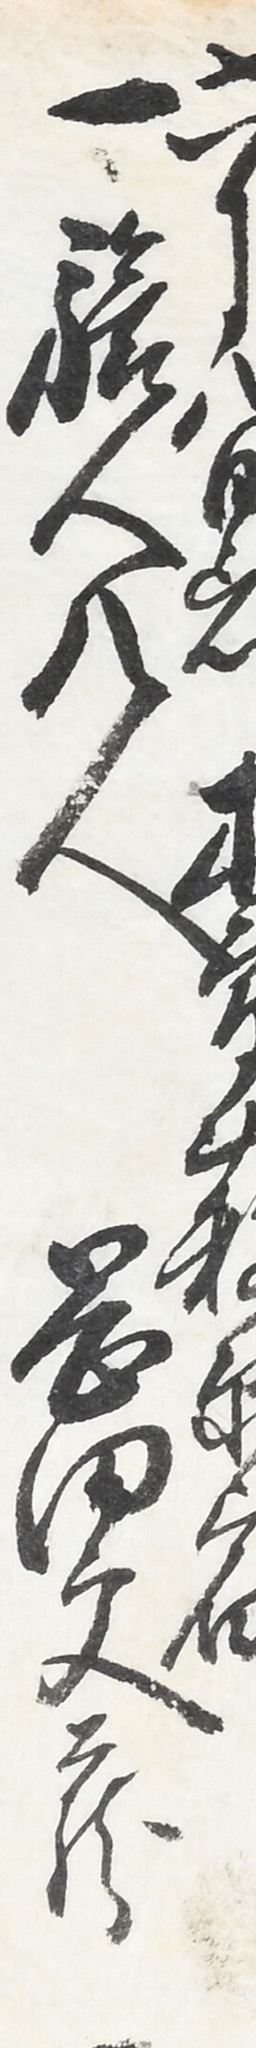一旅人八人岡田文蔵・
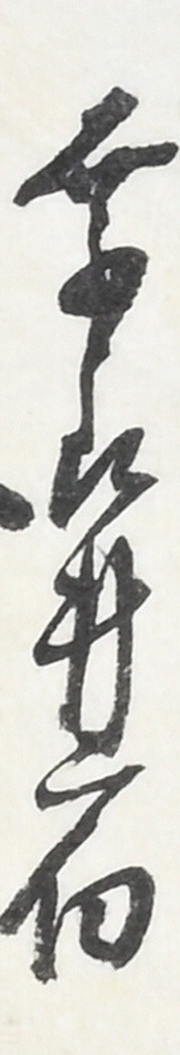奈良井宿
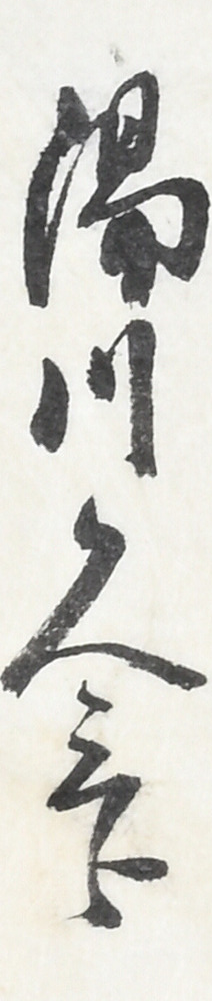湯川久三郎
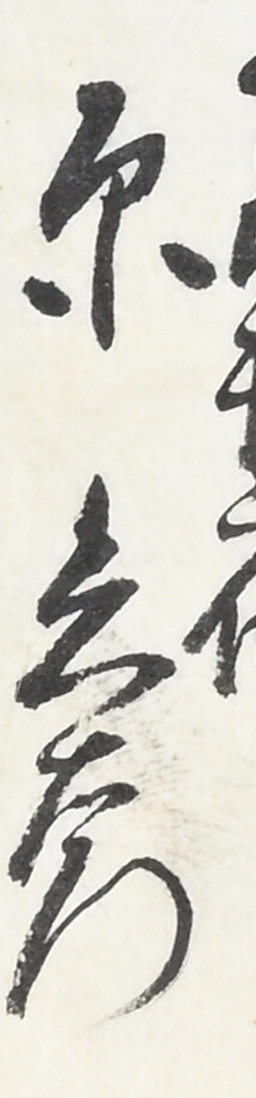原岩右衛門
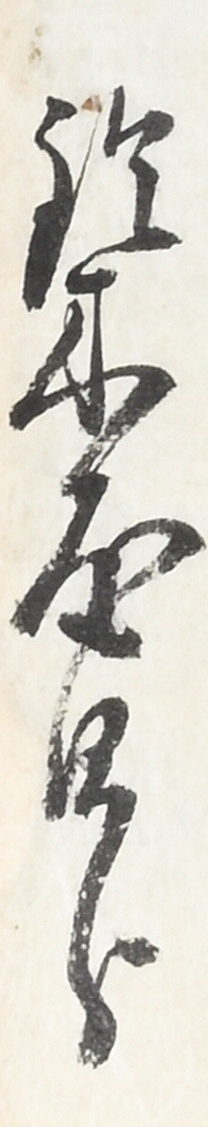鈴木友四郎

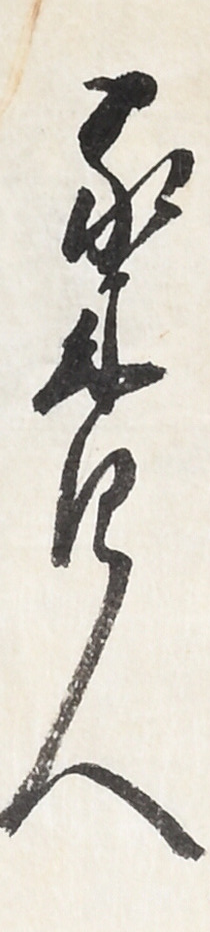家来四人
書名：旅人泊控帳
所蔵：伊那市立高遠町図書館・合同会社AMANE
